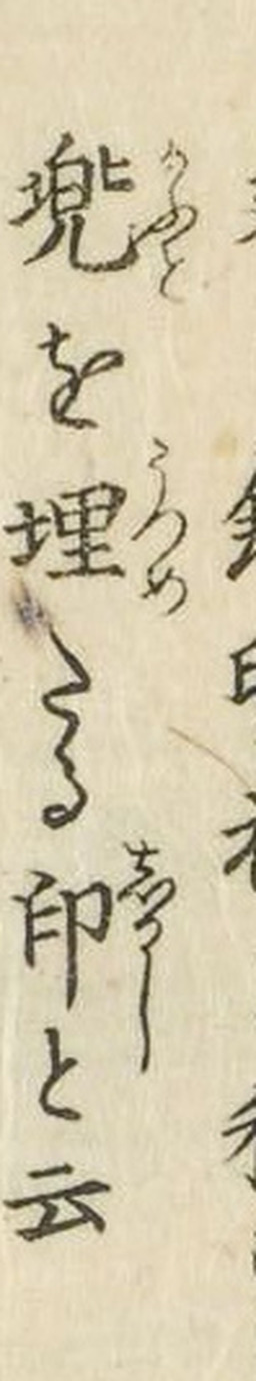兜を埋たる印と云
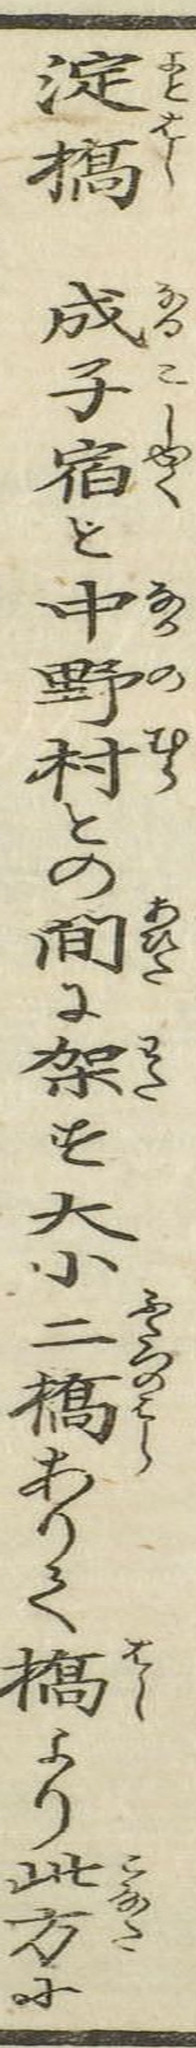淀橋成子宿と中野村との間に架す大小二橋ありて橋より此方に
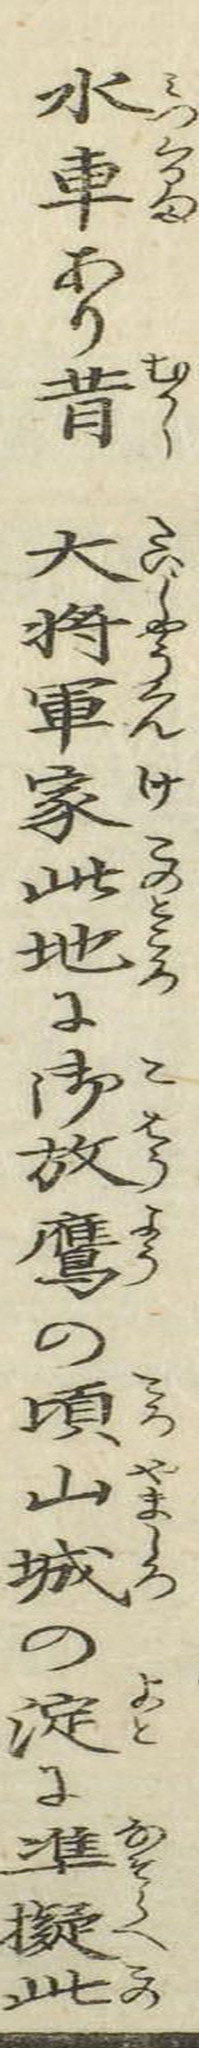水車あり昔大将軍家此地に御放鷹の頃山城の淀に準擬此
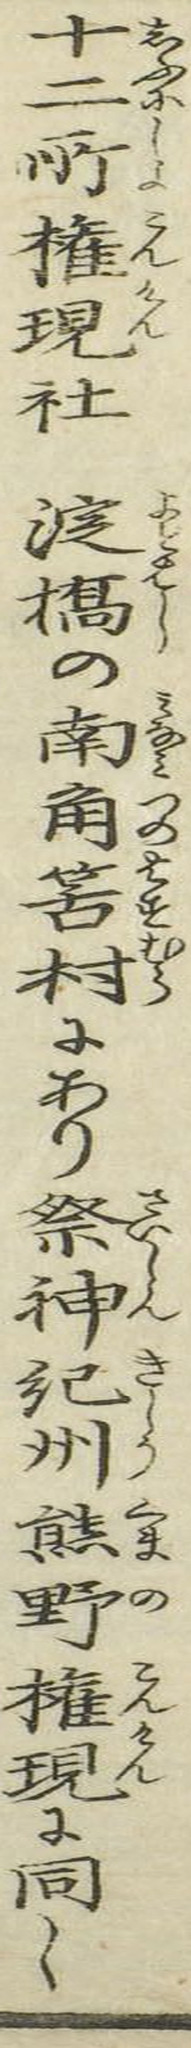十二所権現社淀橋の南角筈村にあり祭神紀州熊野権現に同し
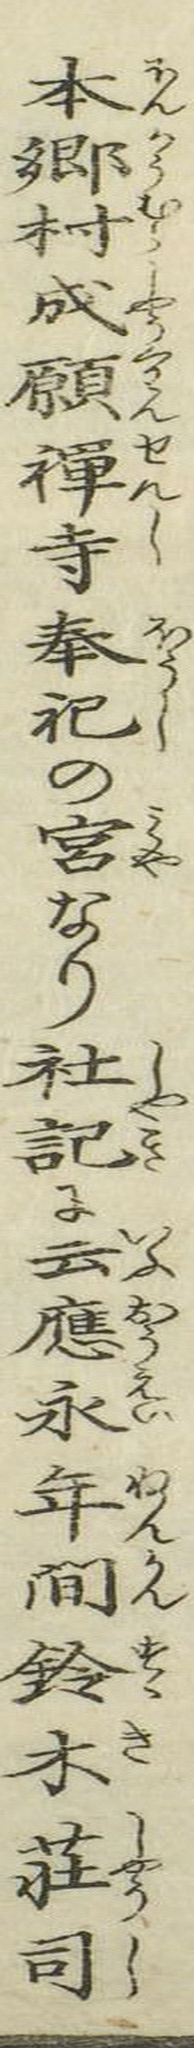本郷村成願禅寺奉祀の宮なり社記に云応永年間鈴木荘司
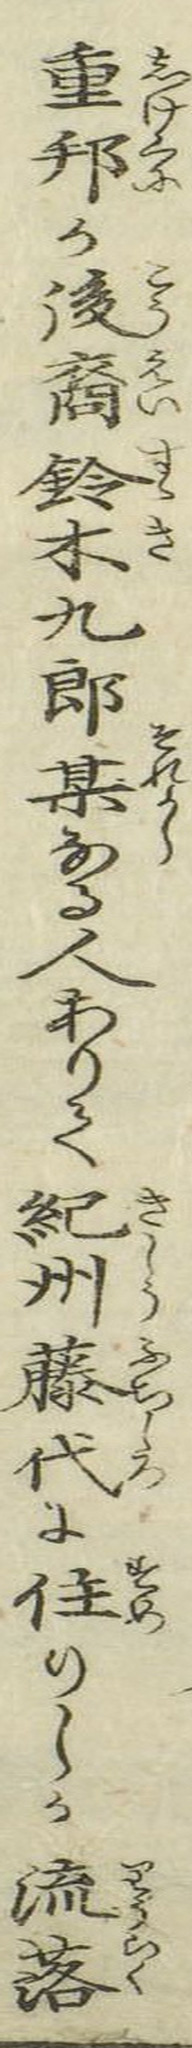重邦か後裔鈴木九郎某なる人ありて紀州藤代に住りしか流落
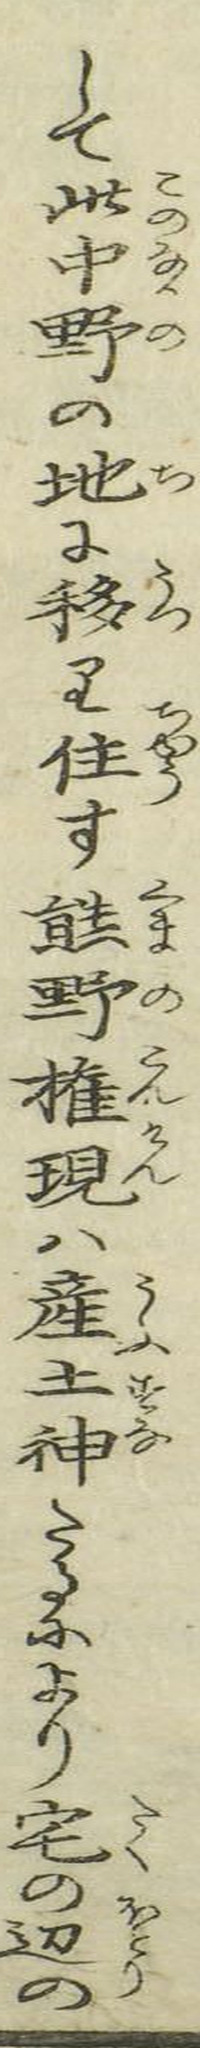して此中野の地に移り住す熊野権現は産土神たるにより宅の辺の
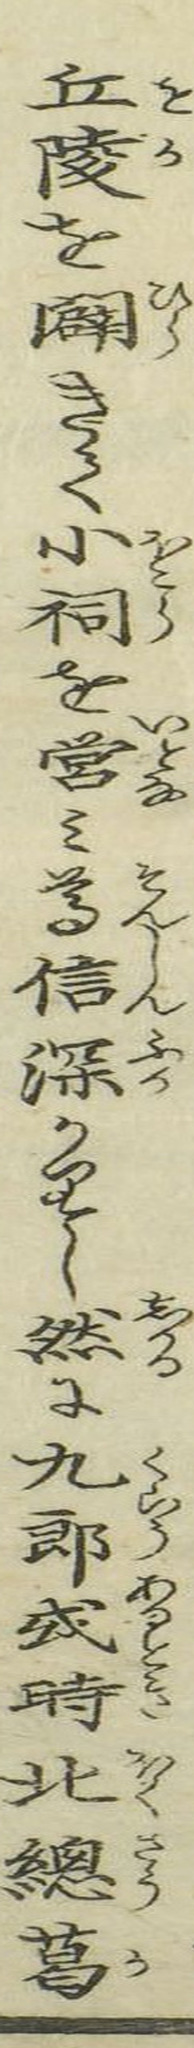丘陵を闢きて小祠を営み尊信深かりし然に九郎或時北総葛

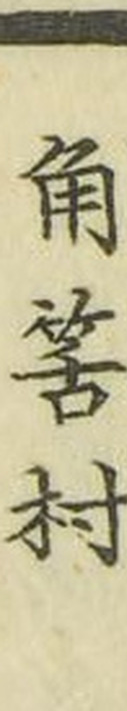角筈村
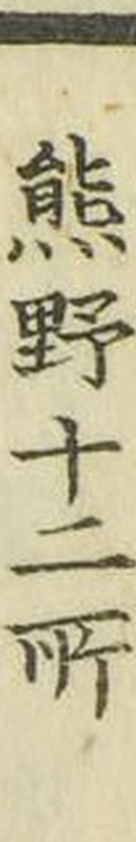熊野十二所
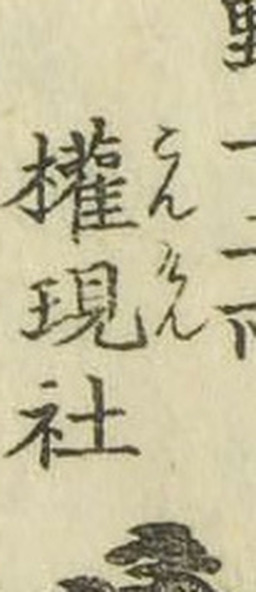権現社
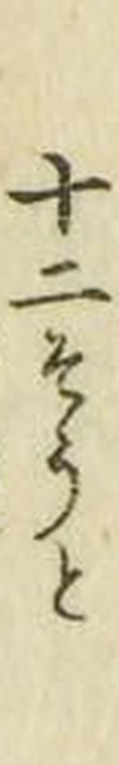十二そうと
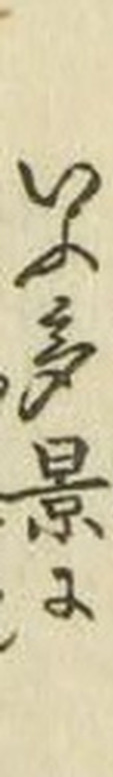いふ多景に
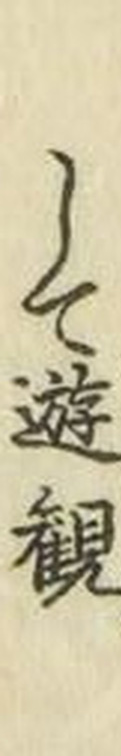して遊観

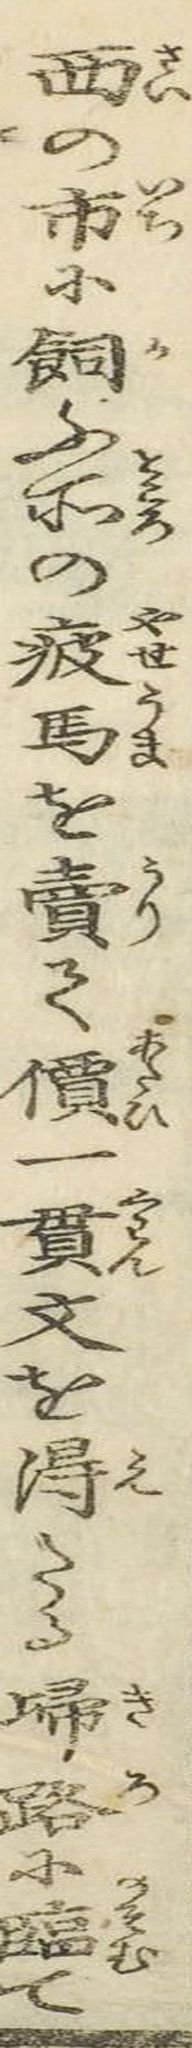西の市に飼ふ所の疲馬を売て価一貫文を得たる帰路に臨て
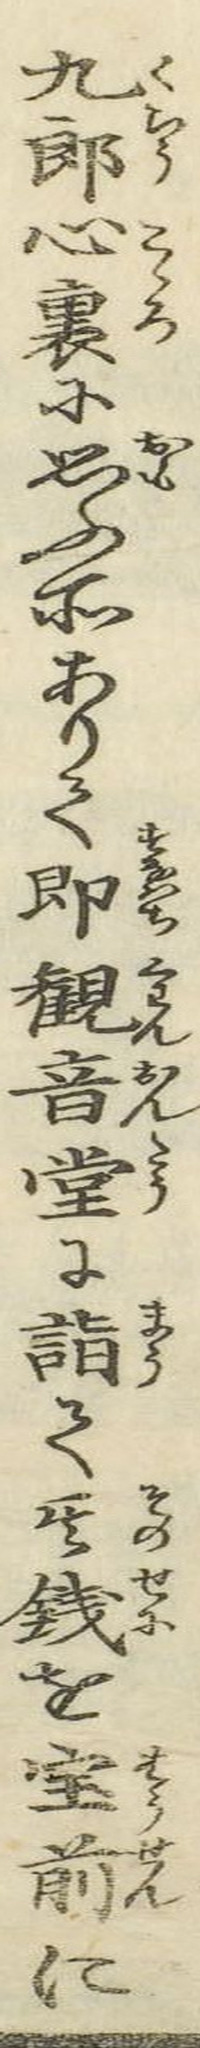九郎心裏に思ふ所ありて即観音堂に詣て其銭を宝前に
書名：江戸名所図会 20巻 巻之11
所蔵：東京学芸大学教育コンテンツアーカイブ
